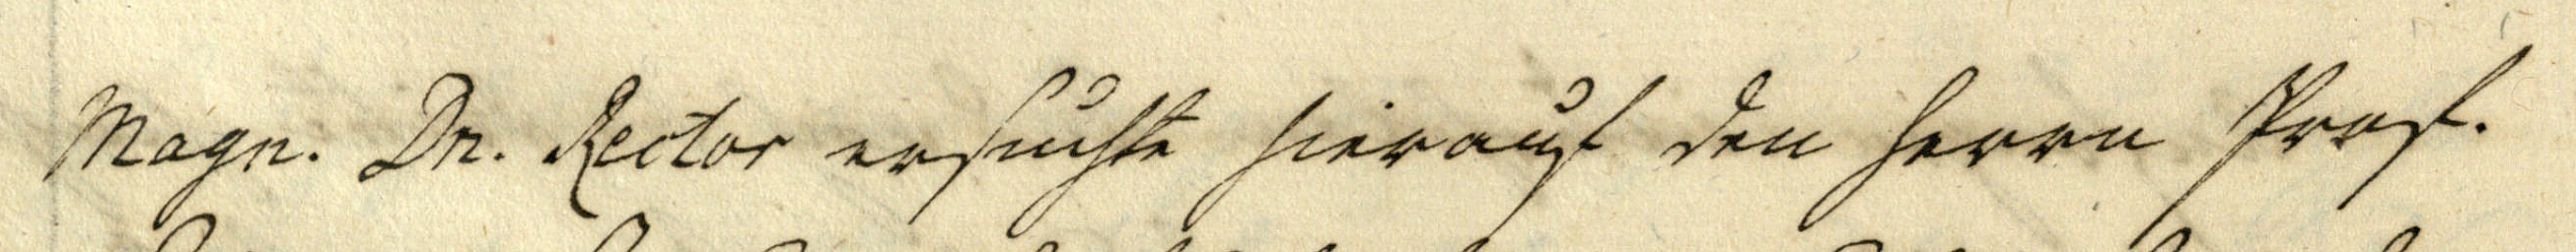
Magn. Dn. Recotr ersuchte hierauf den herrn Prof.
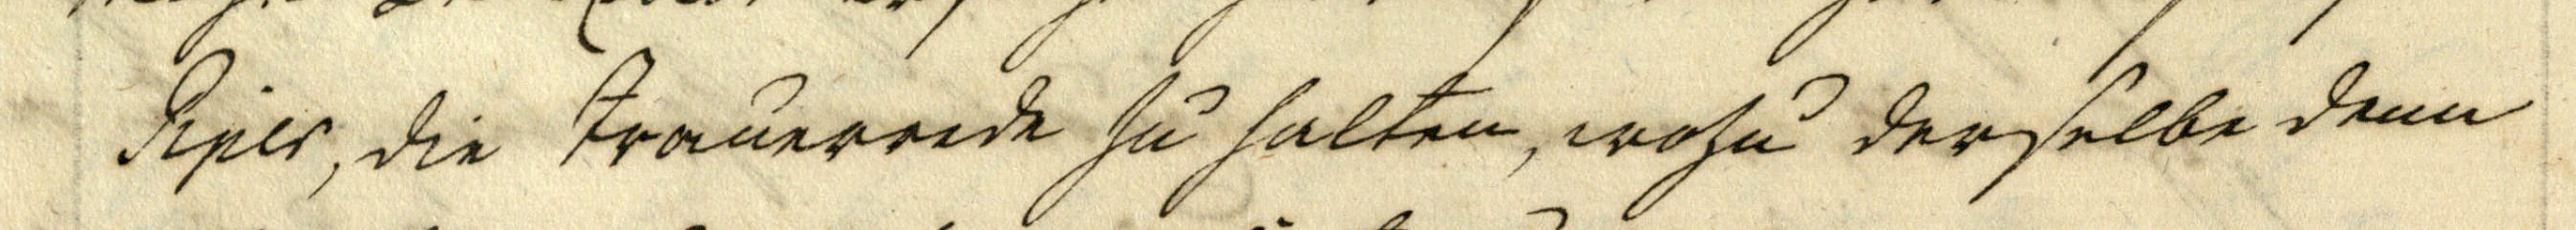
Piper, die Trauerrede zu halten, wozu derselbe denn
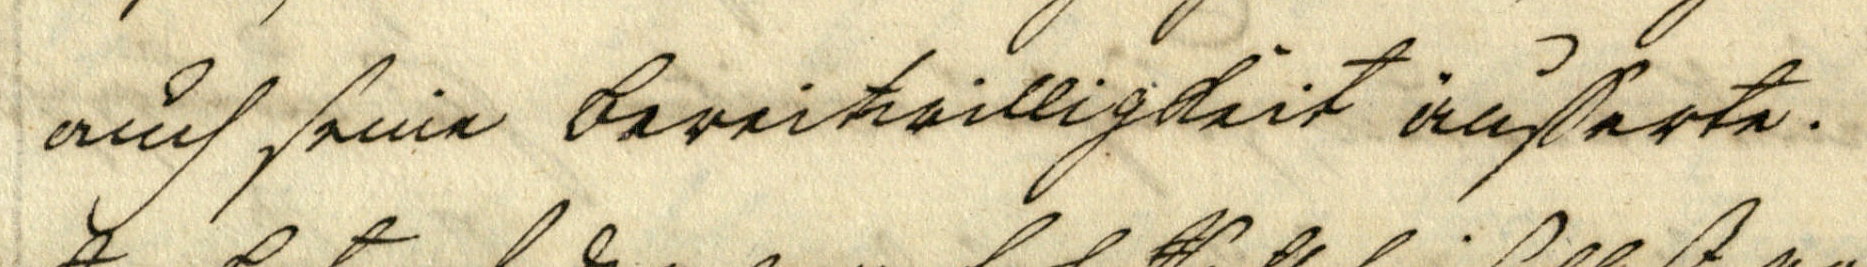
auch eine Bereitwilligkeit äusserte.
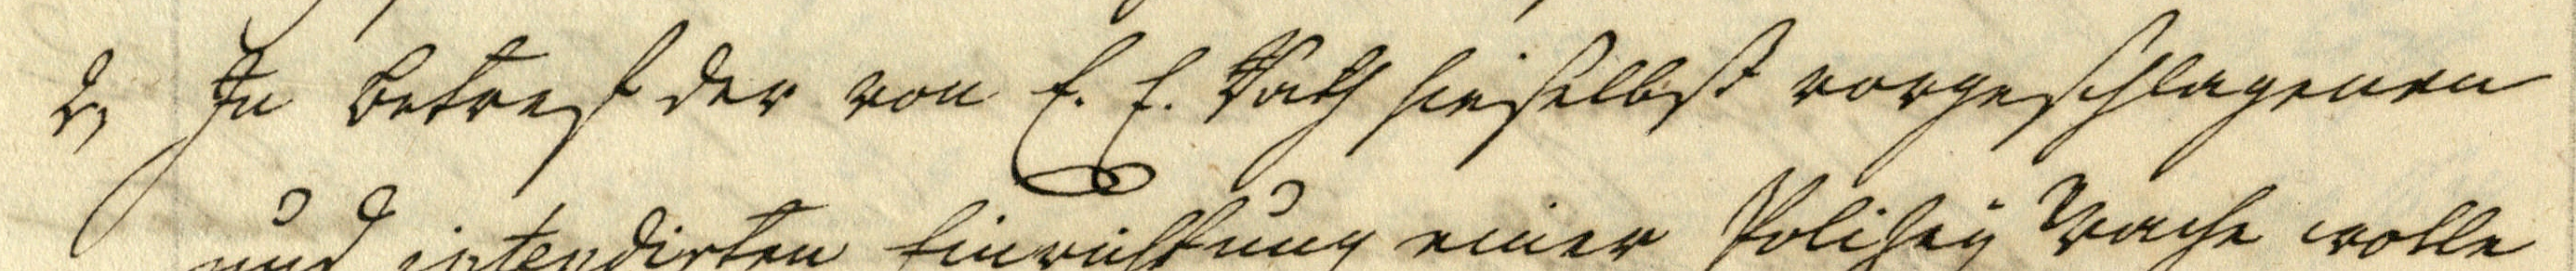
2., In Betref der von E. E. Rath hieselbst vorgeschlagenen
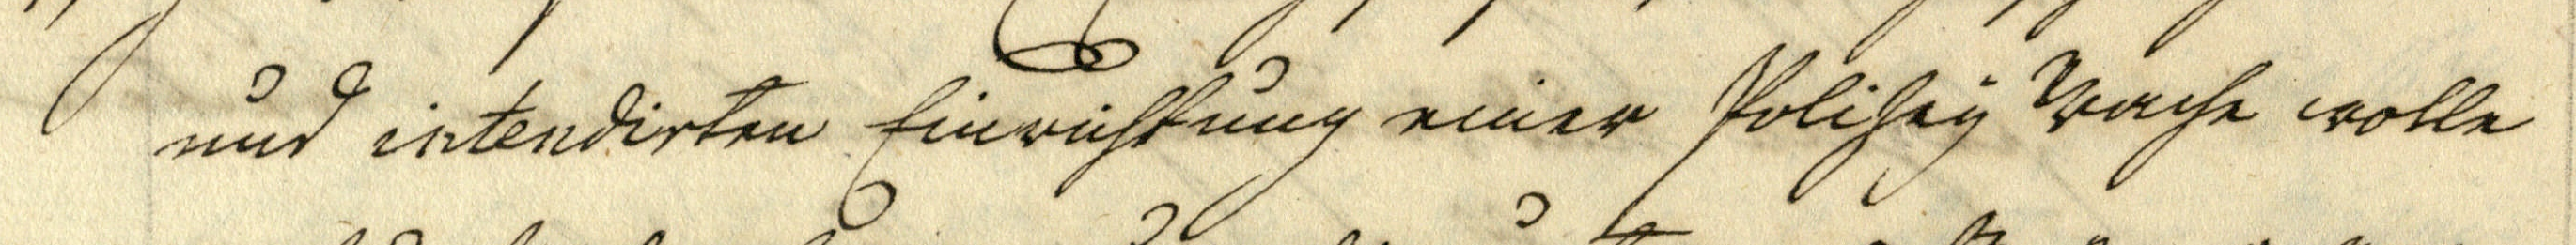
und intendirten Einrichtung einer Polizey Wache wolle
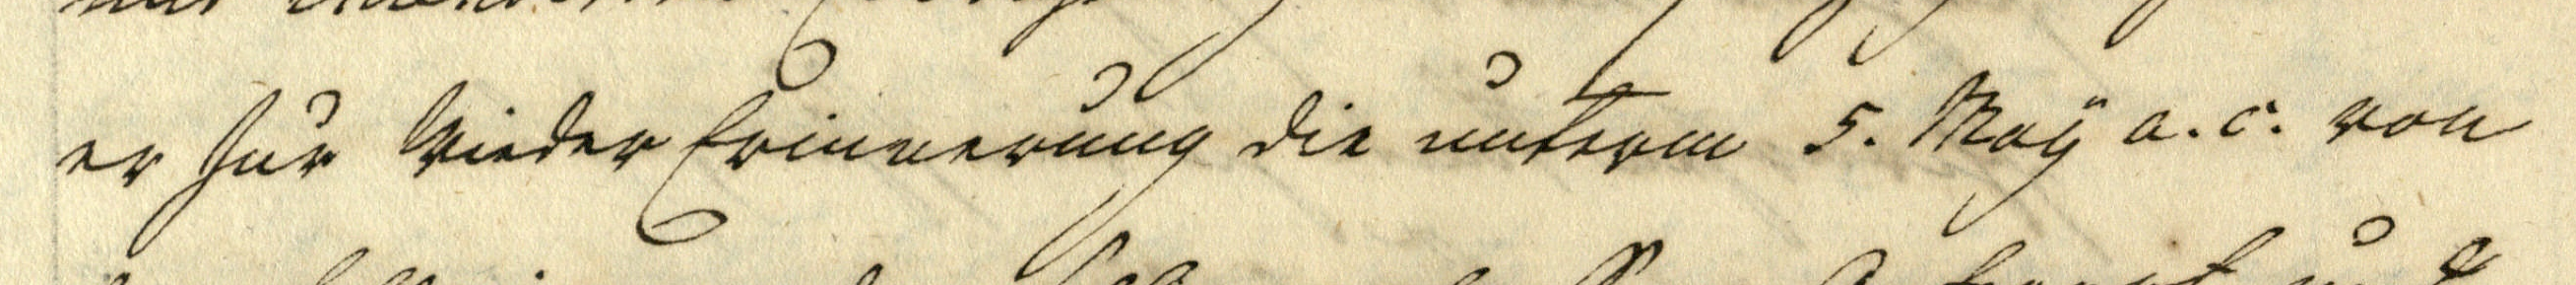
er zur Wieder Erinnerung die unterm 5. May a. c. von
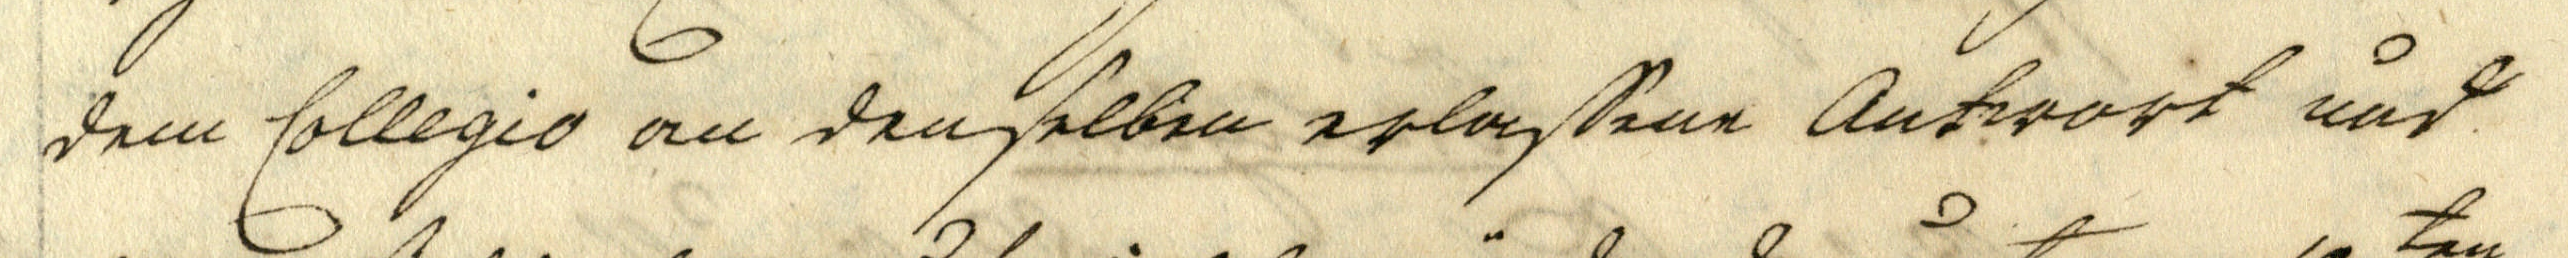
dem Collegio an denselben erlassene Antwort und
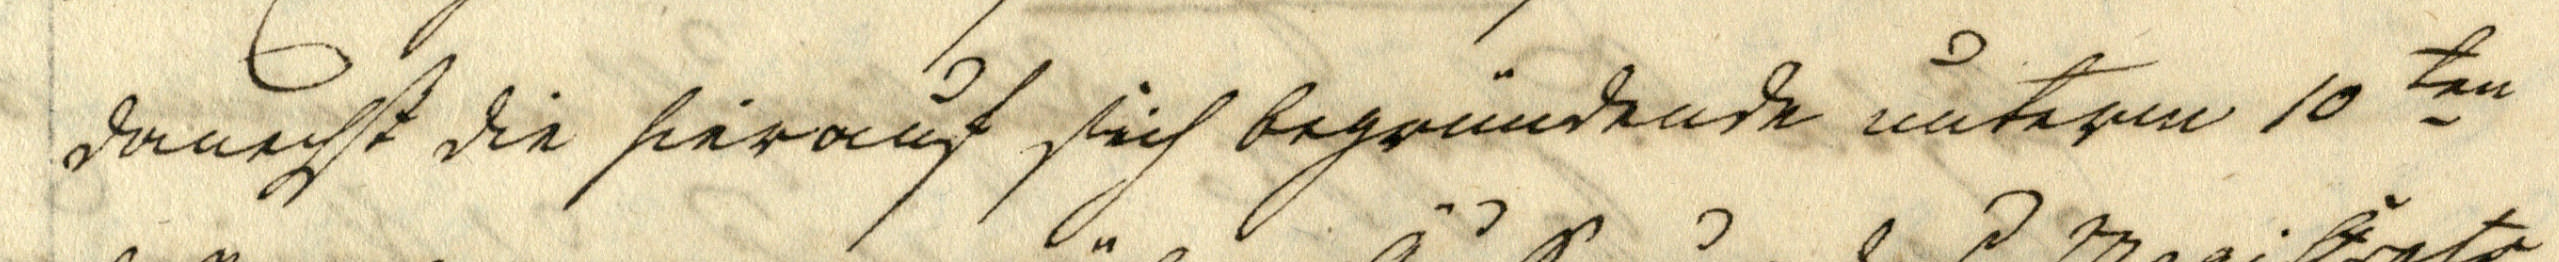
danechst die hierauf sich begründende unterm 10ten
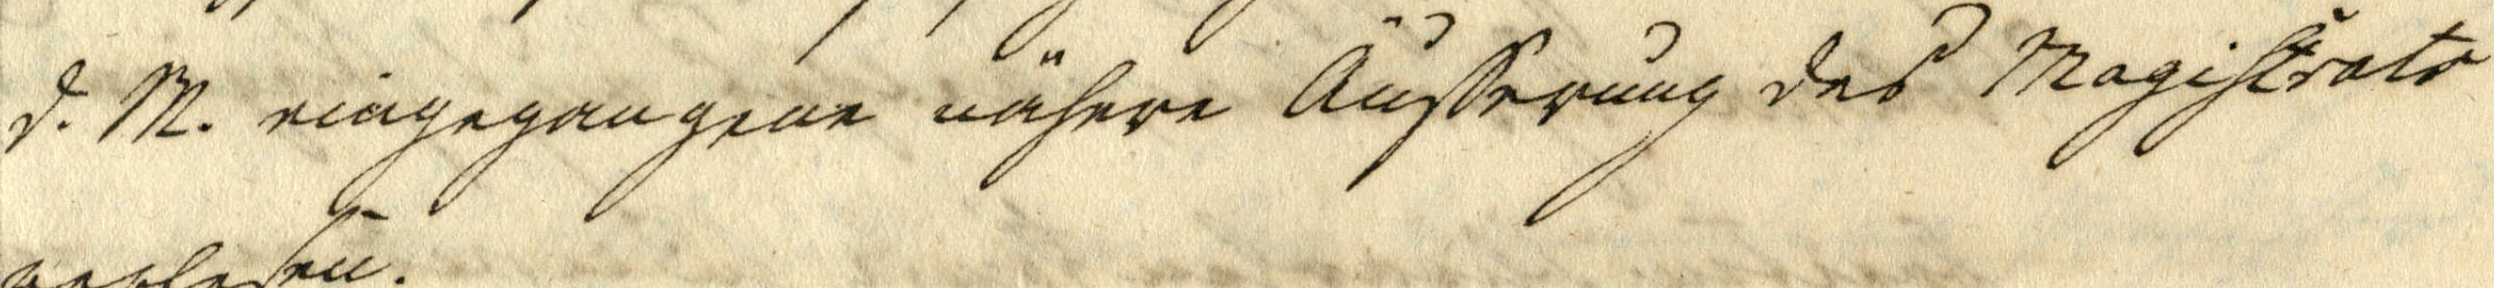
d. M. eingegangene nähere Äusserung des Magistrats
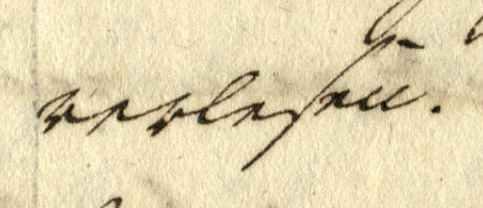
verlesen.
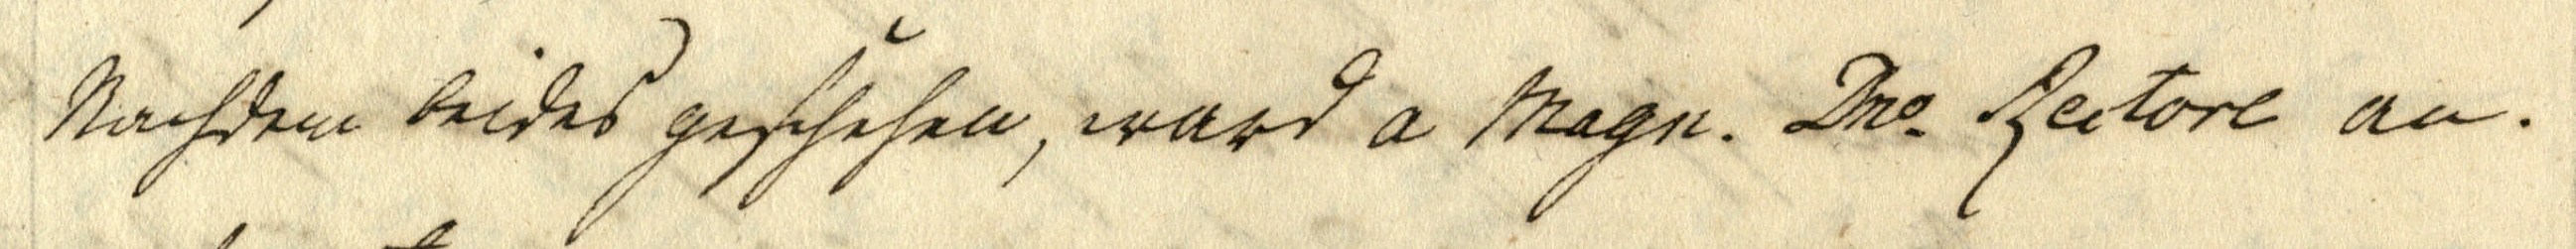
Nachdem beides geschehen, ward a Magn. Dno. Rectore an-
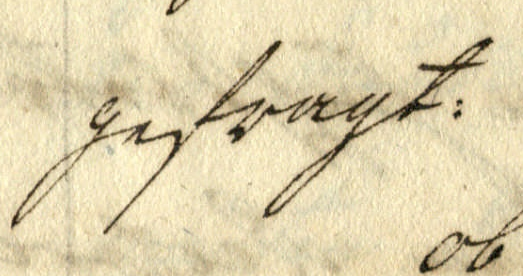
gefragt:
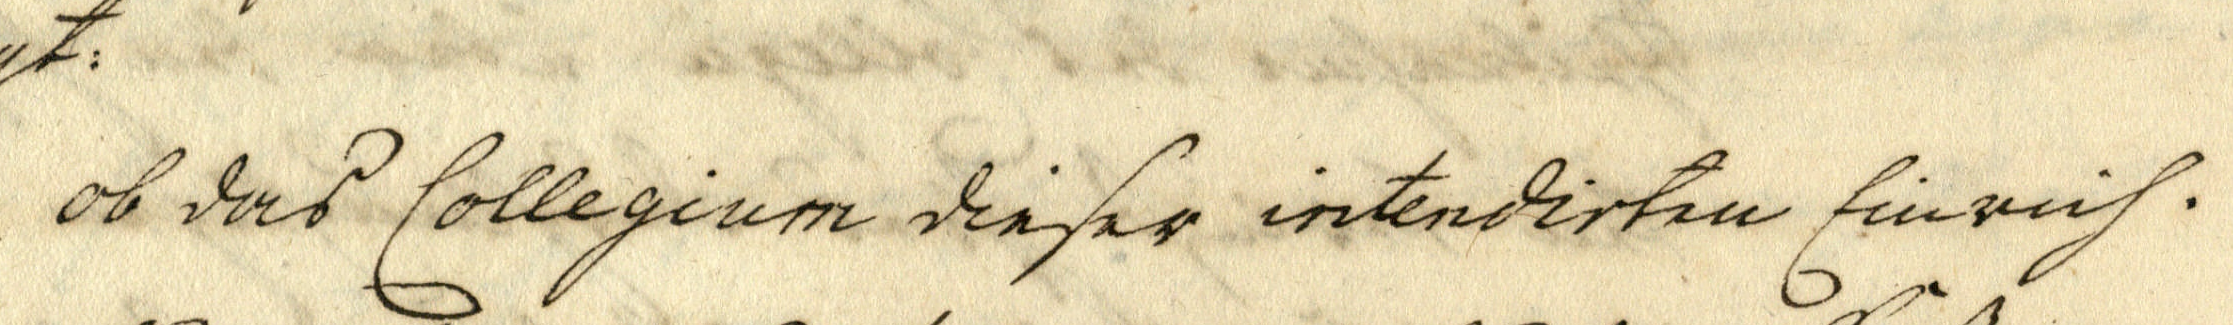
ob das Collegium dieser intendirten Einrich-
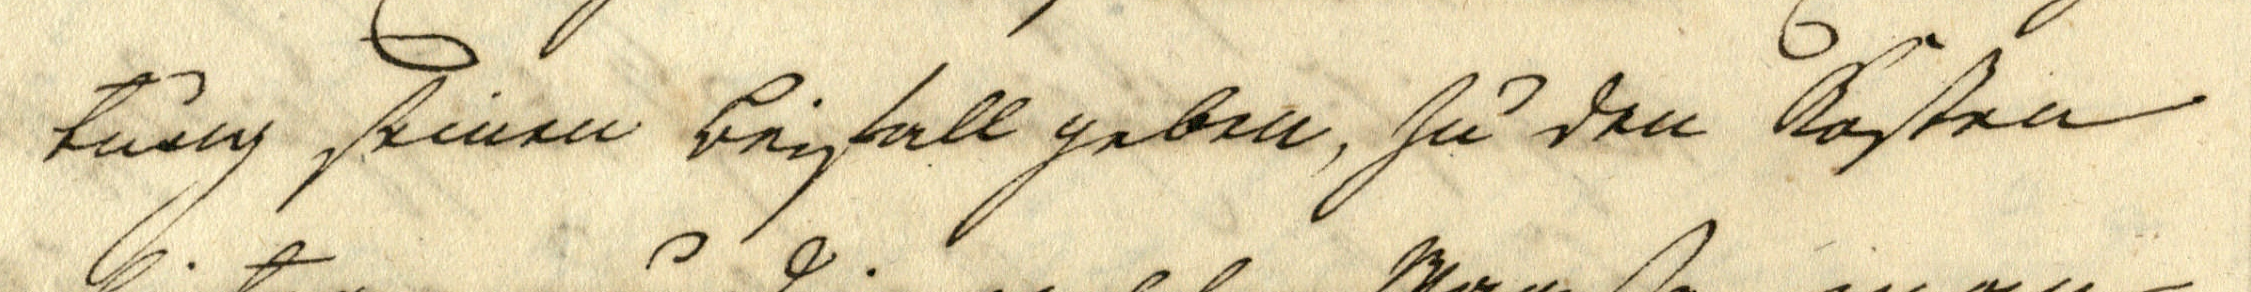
tung seinen Beifall geben, zu den Kosten
